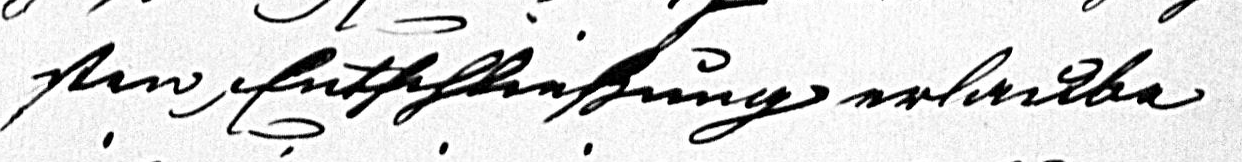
sten Entschließung erlaube
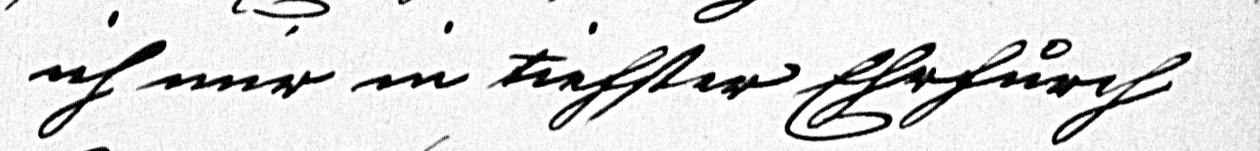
ich mir in tiefster Ehrfurch
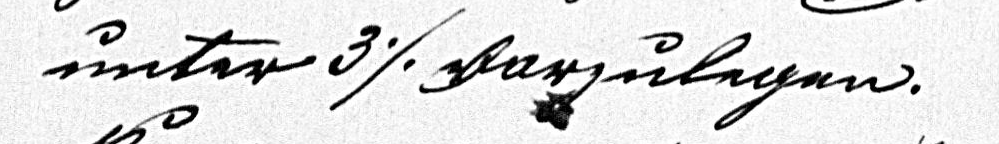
unter 3./. vorzulegen.
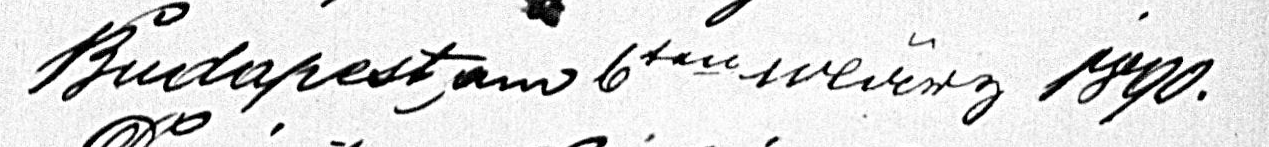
Budapest am 6ten März 1890.
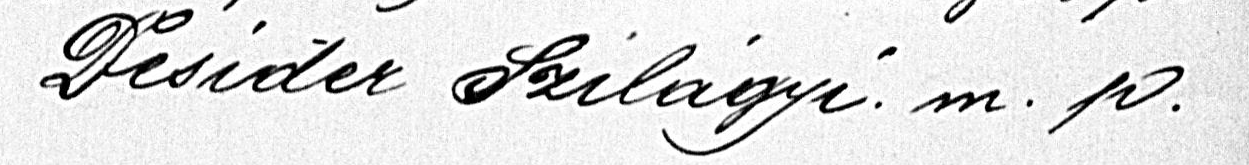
Desider Szilagyi. m. p.
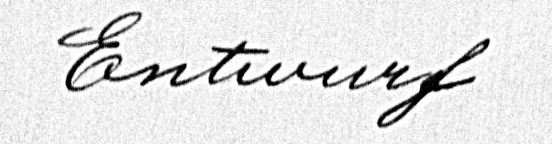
Entwurf
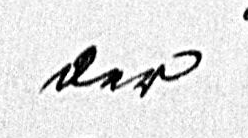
der
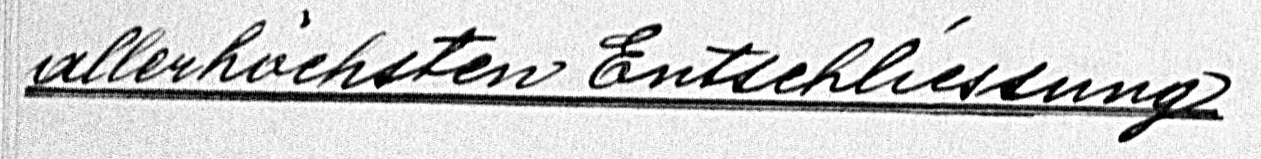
allerhöchsten Entschliessung
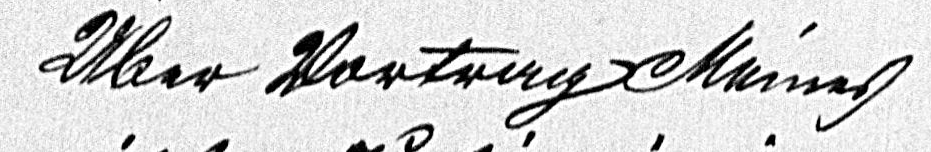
Über Vortrag Meines
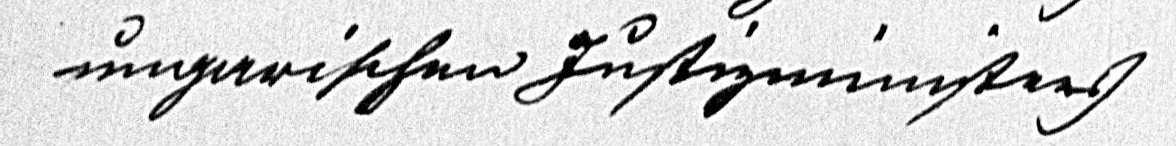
ungarischen Justizministers
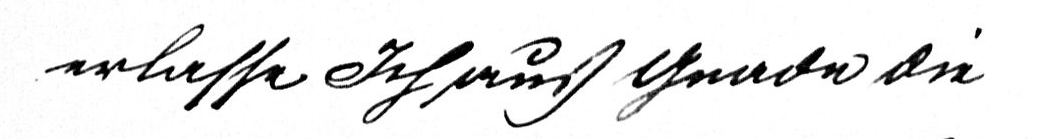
erlasse Ichaus Gnade die
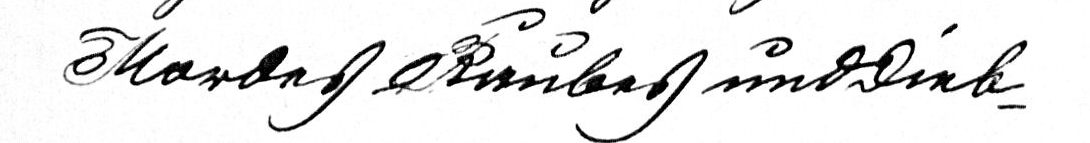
Mordes Raubes und Dieb¬
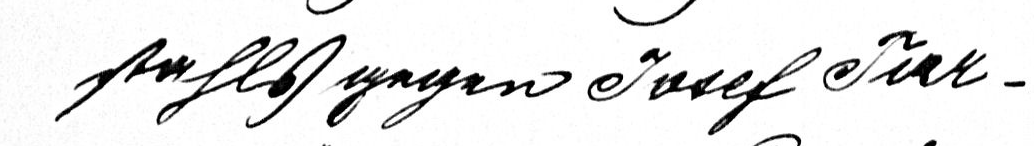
stahls gegen Josef Tur¬
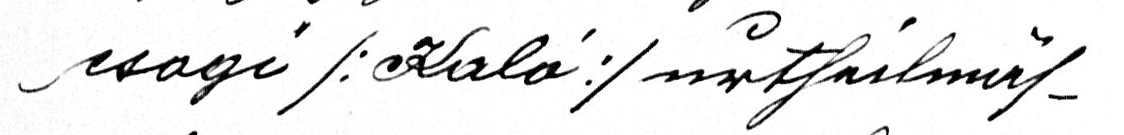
csogi /:Kaló:/ urtheilmäs¬
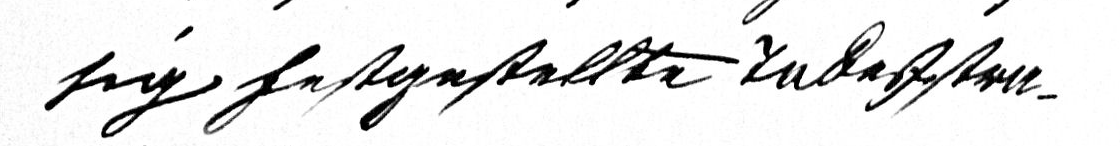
sig festgestellte Todesstra¬
